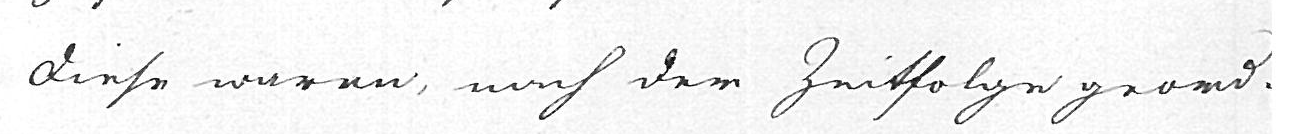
Diese waren, nach der Zeitfolge geord-
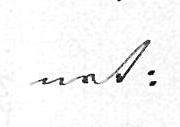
net:
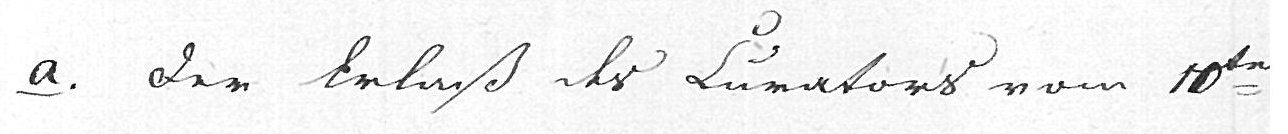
a. Der Erlaß des Curators vom 10ten
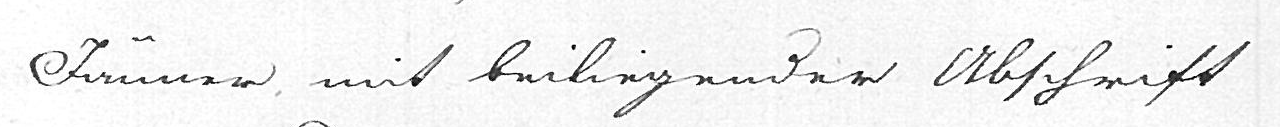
Jänner mit beiliegender Abschrift
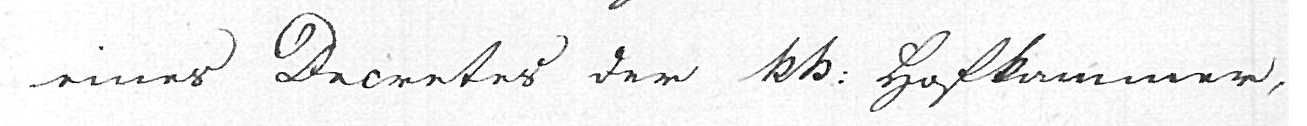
eines Decretes der kk: Hofkammer,
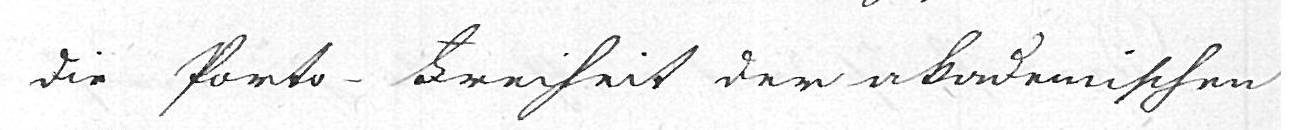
die Porto-Freiheit der akademischen
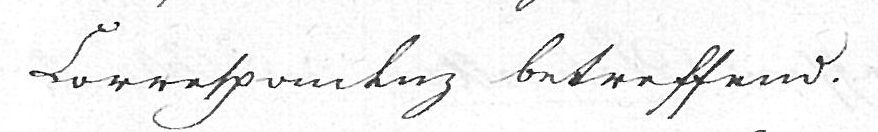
Correspondenz betreffend.
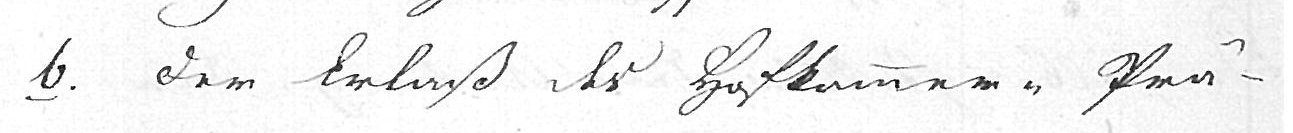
b. Der Erlaß des Hofkammer-Prä-
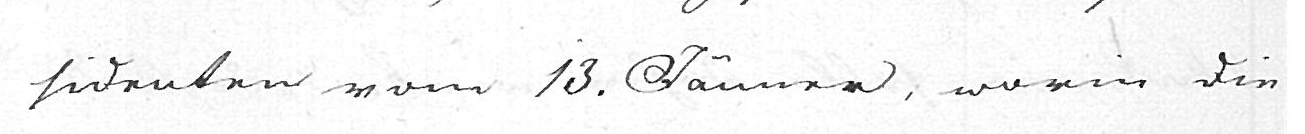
sidenten vom 13. Jänner, worin die
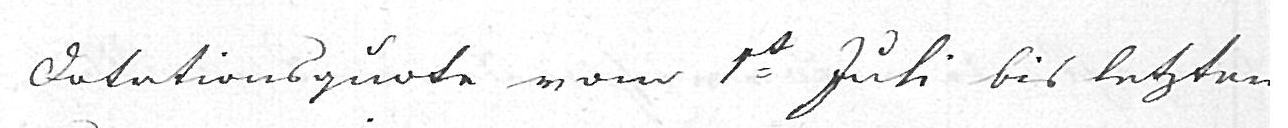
Dotationsquote vom 1ten Juli bis letzten
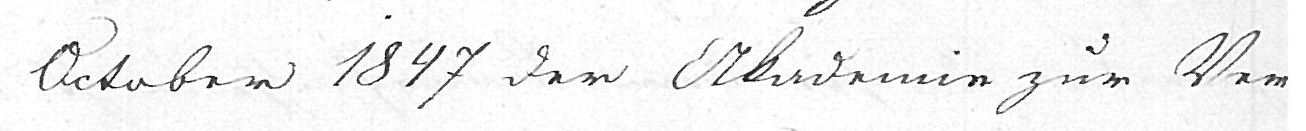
October 1847 der Akademie zur Ver-
